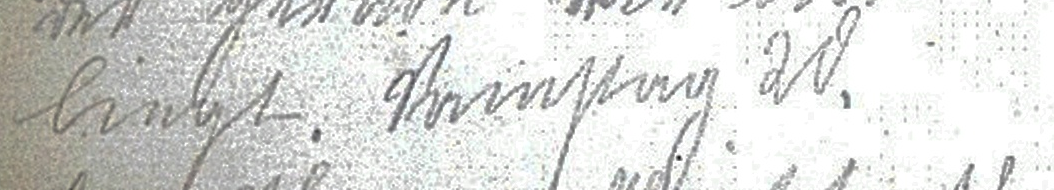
liegt. Samstag 20.
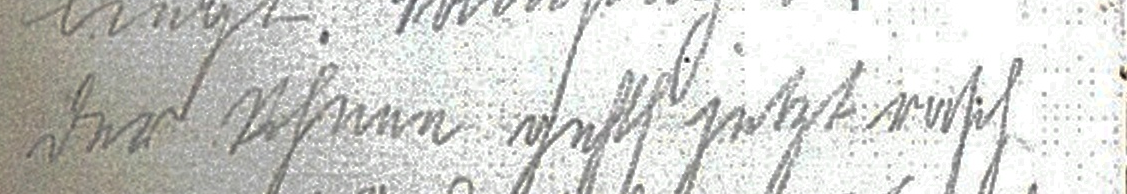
der Schnee geht jetzt rasch
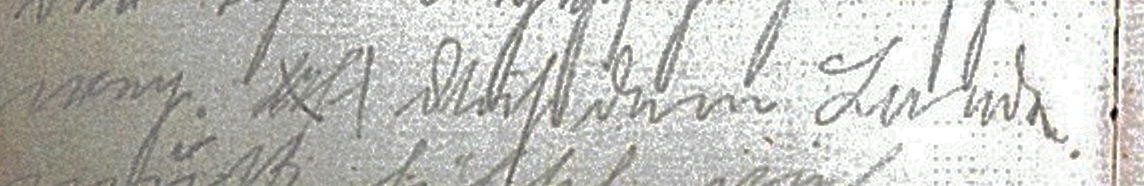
weg. Auf dem Lande
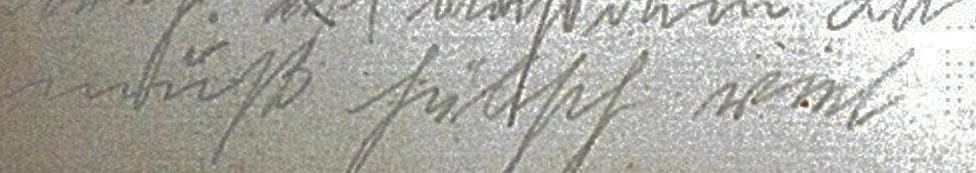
muß hübsch viel
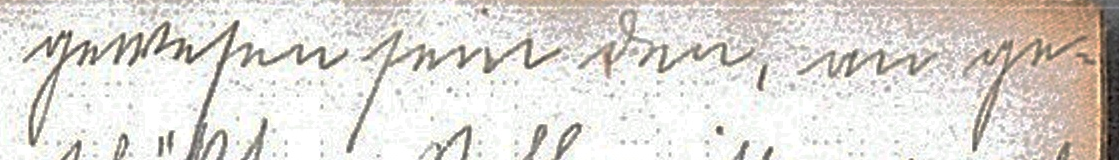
gewesen sein den an ge-
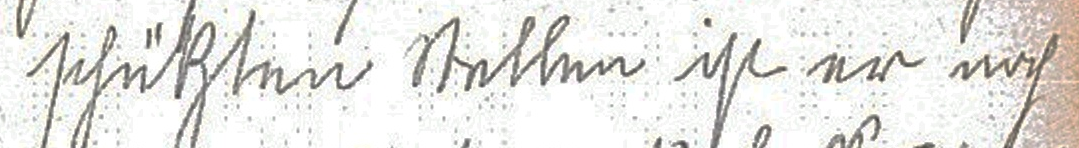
schützten Stellen ist er noch
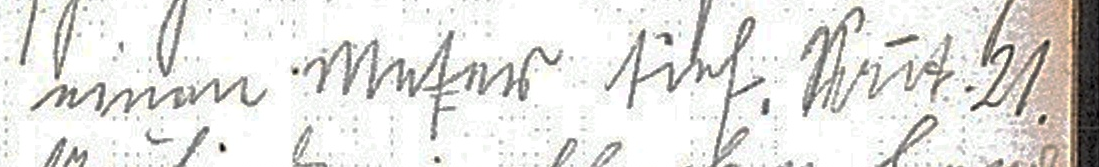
einen Meter tief. Sont 21
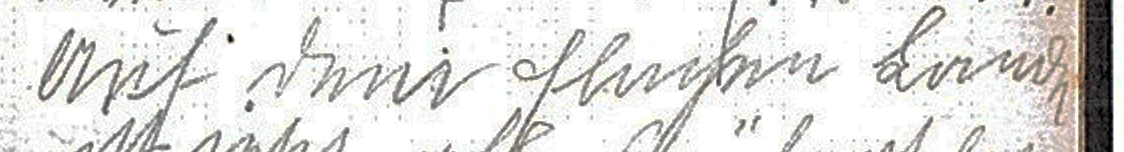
Auf dem flachen Lande
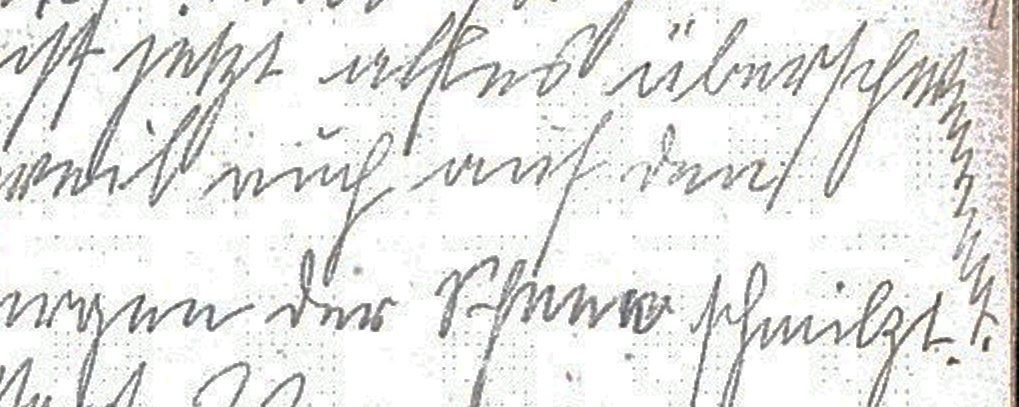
ist jetzt alles überschwemmt
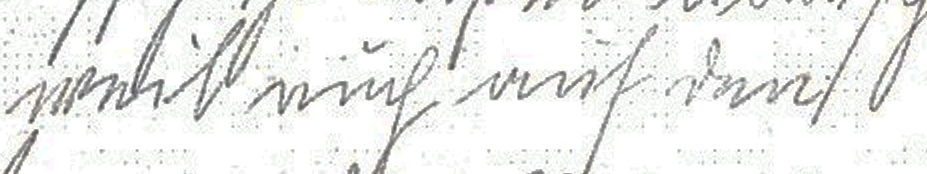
weil auch auf den
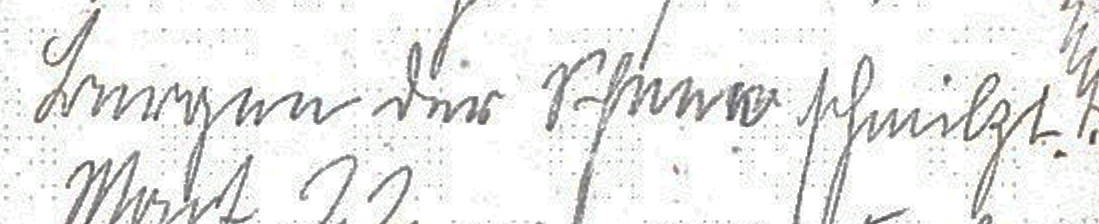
Bergen der Schnee schmilzt.
